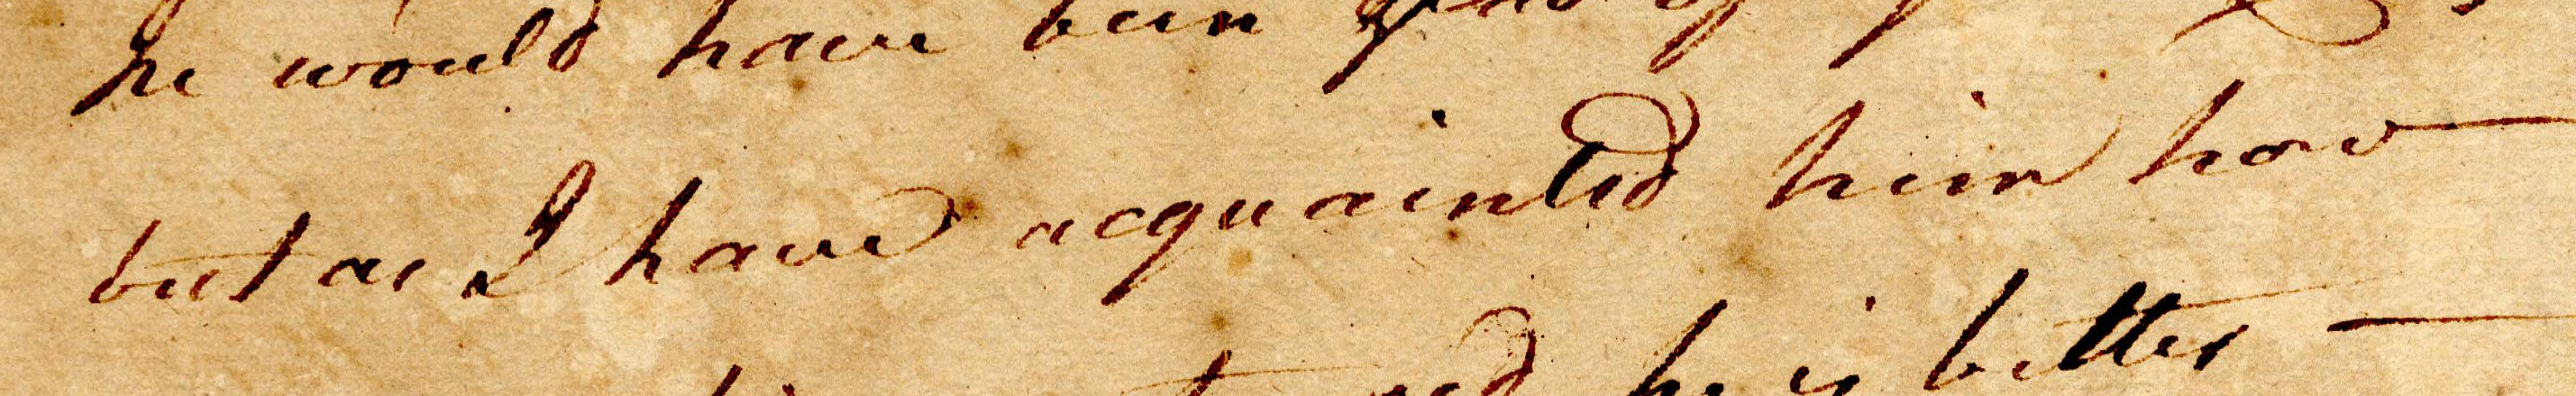but as I have aquainted him how
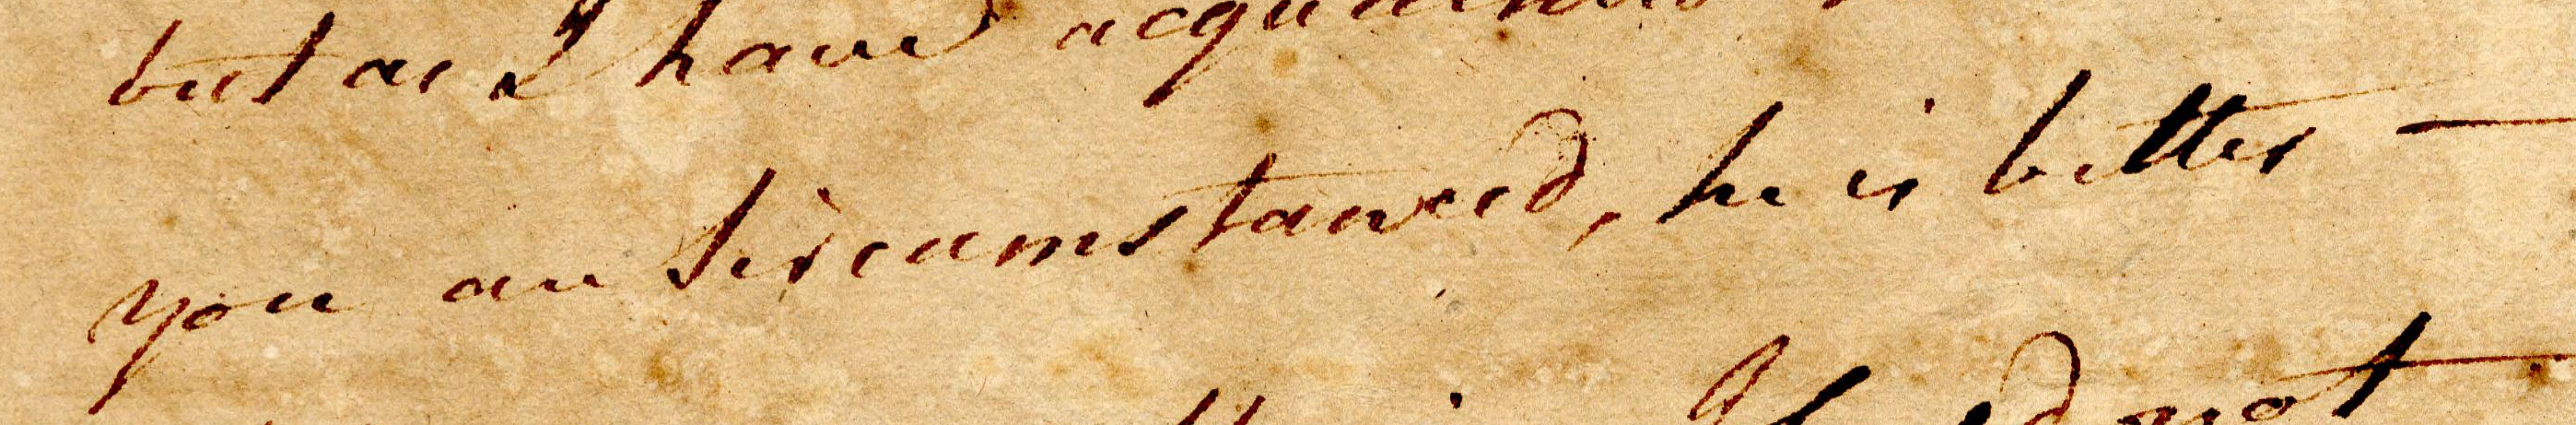you are Sircumstanced, he is better-
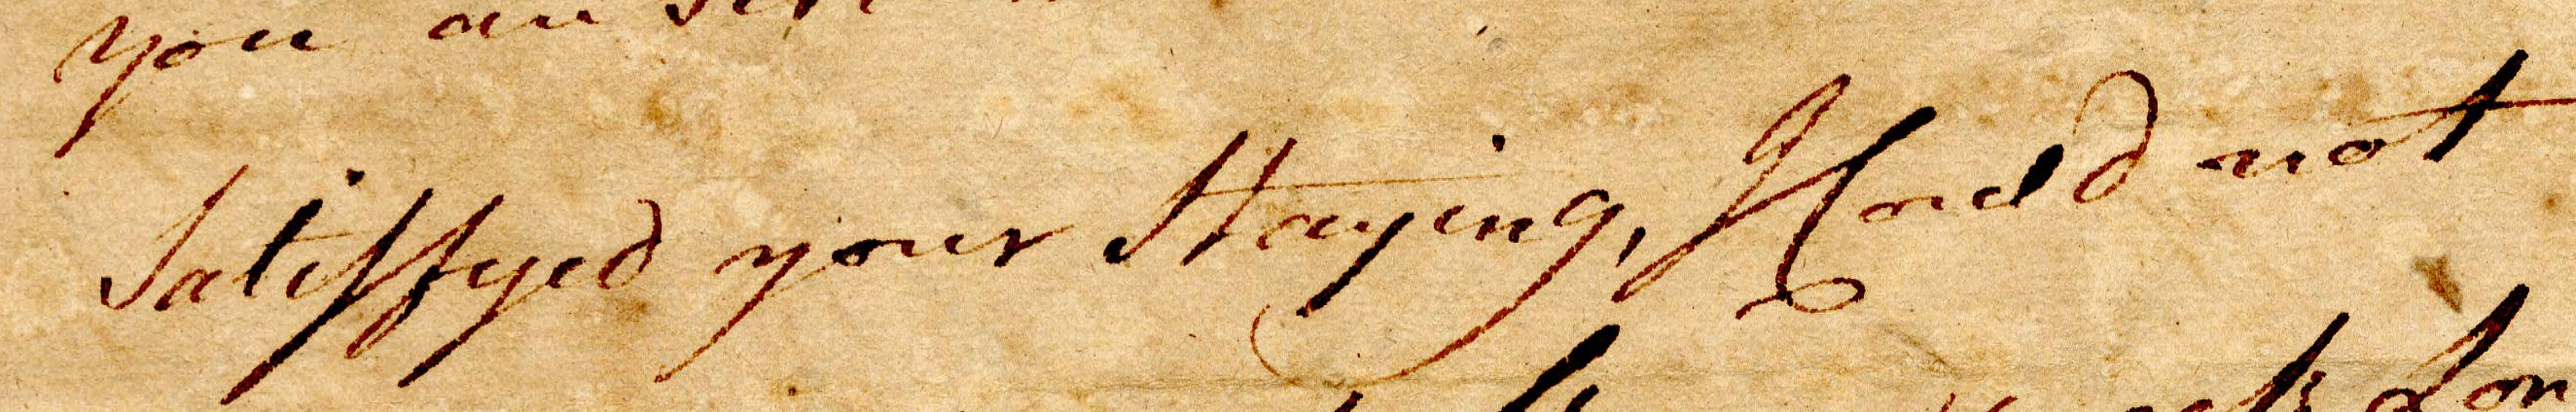Satisfyed your Staying, & Could not
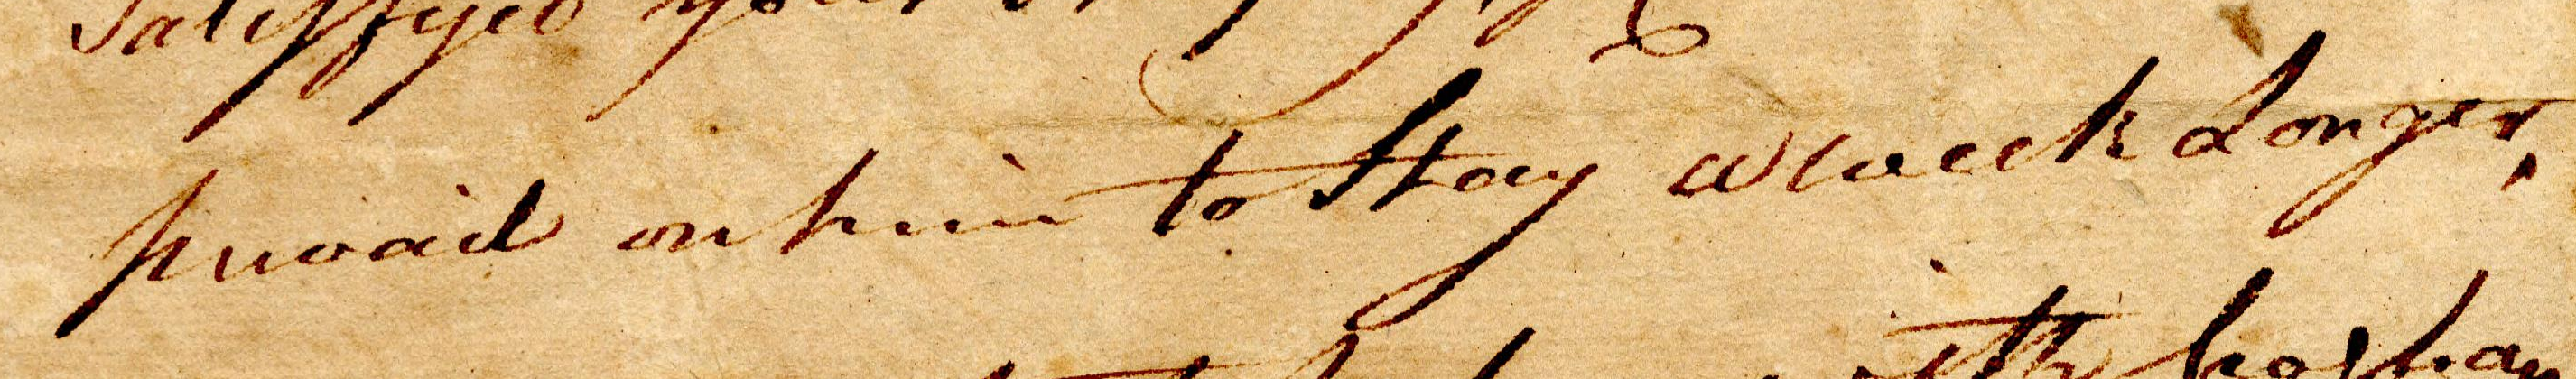prevail on him to Stay a week Longer
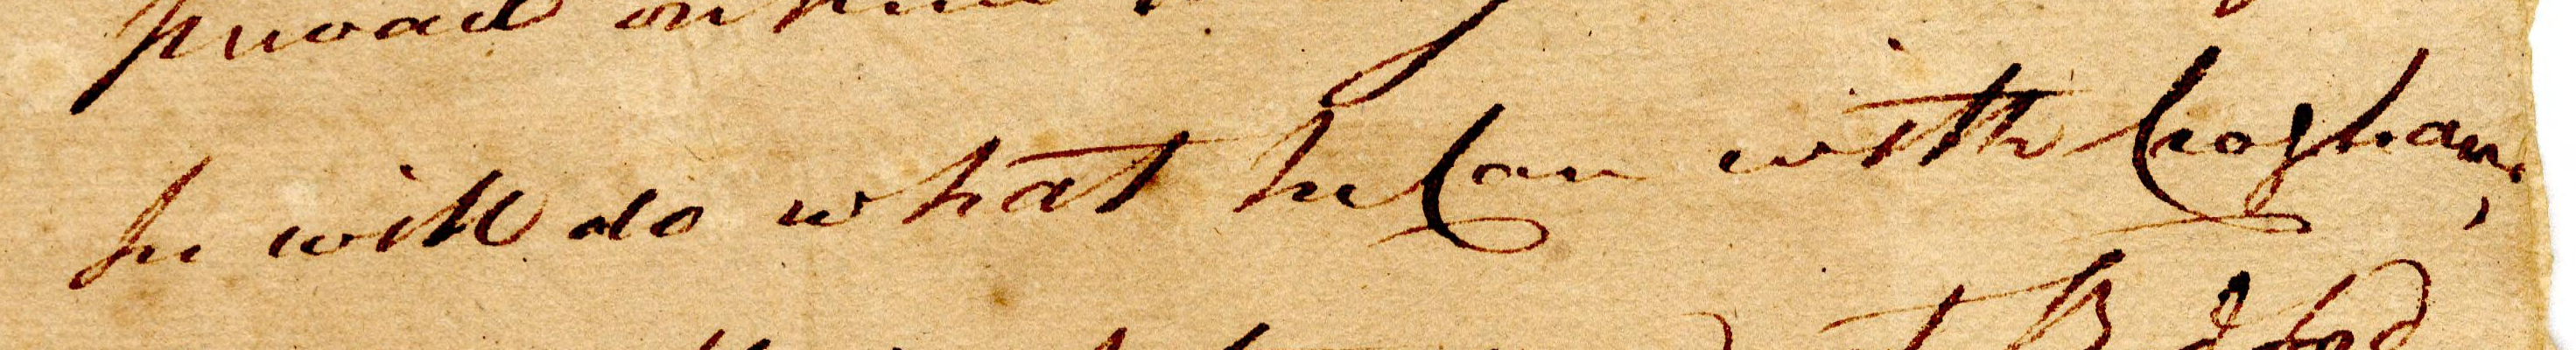he will do what he Can with Croghan
